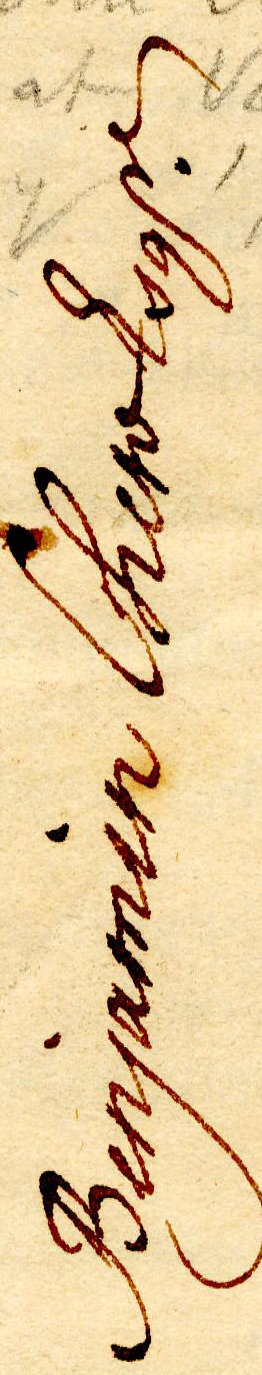Benjamin Chew Esq^r.
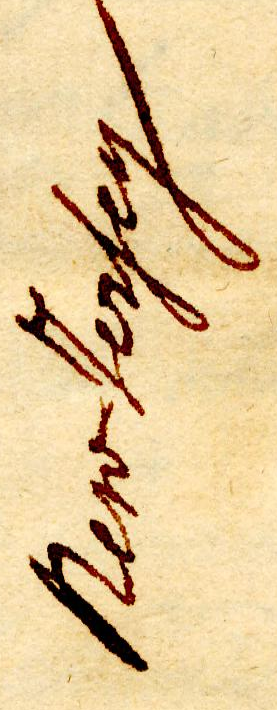New Jersey
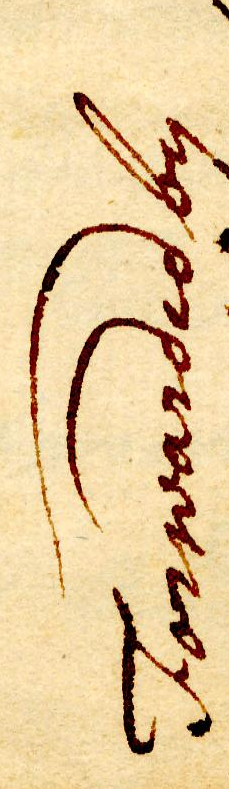Forwarded by
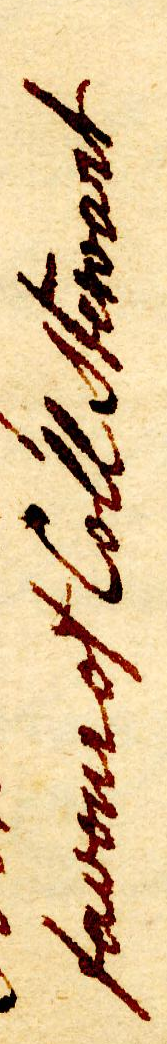favour of Coll Stewart
